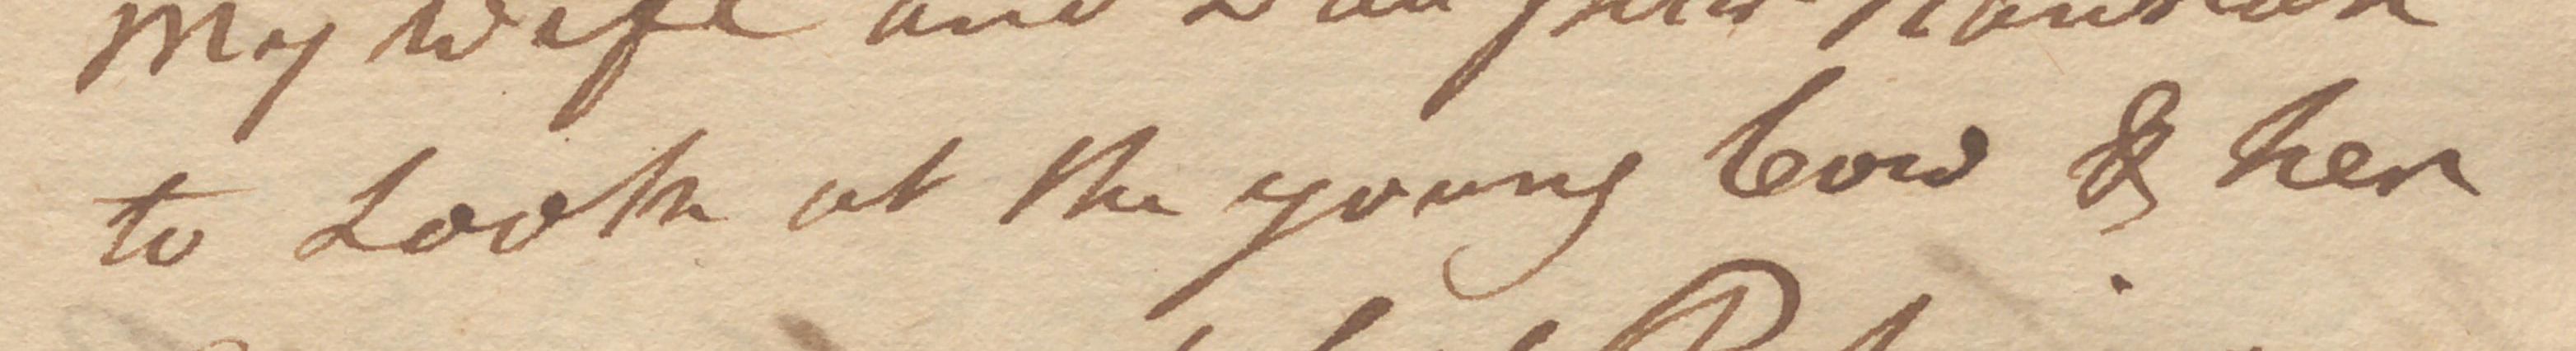to Look at the young Cow & her
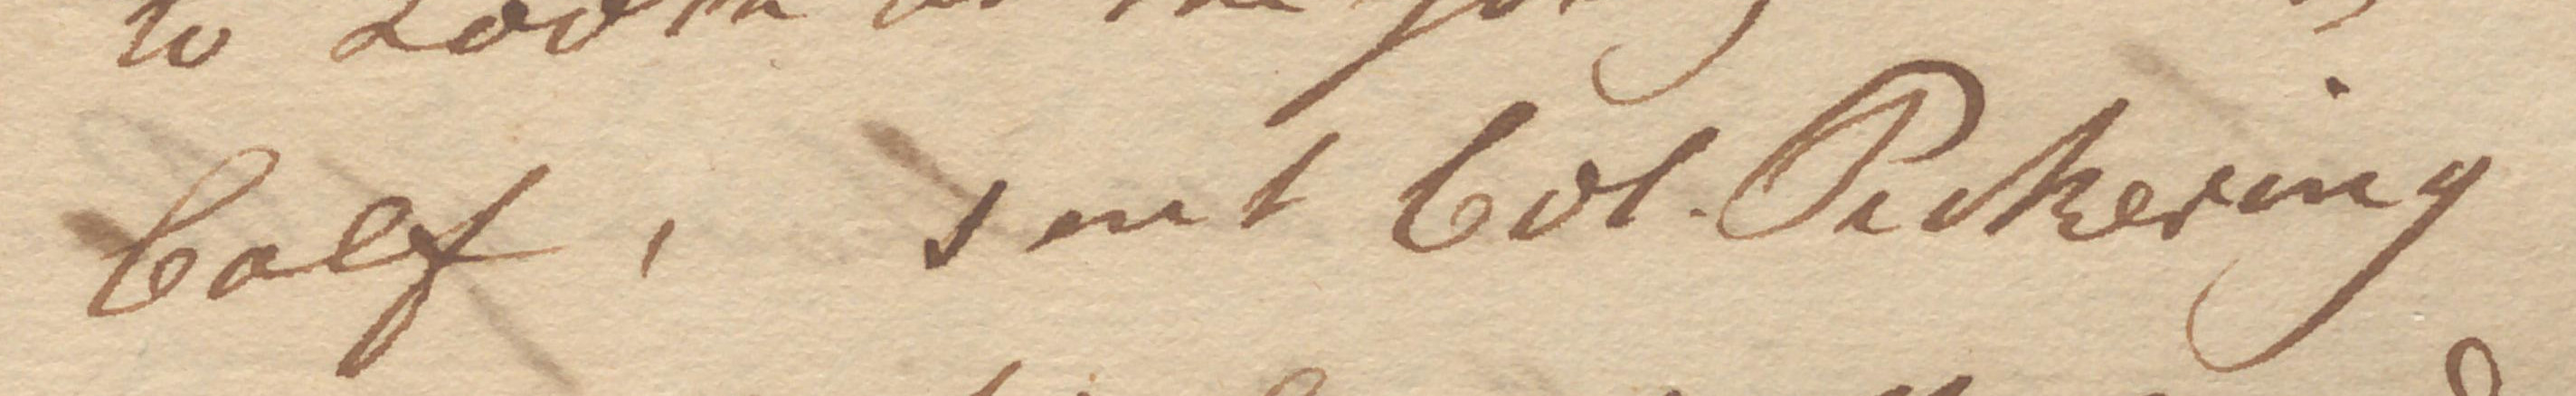Calf, sent Col. Pickering
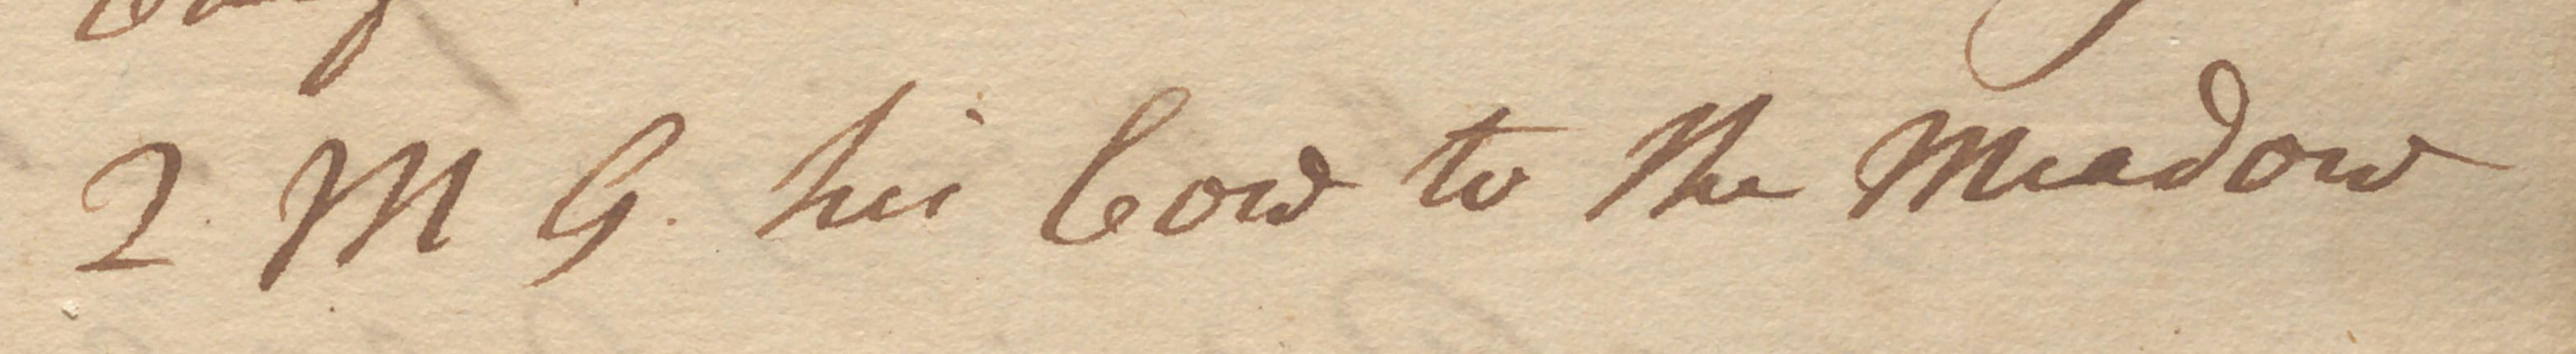QMG. his Cow to the Meadow
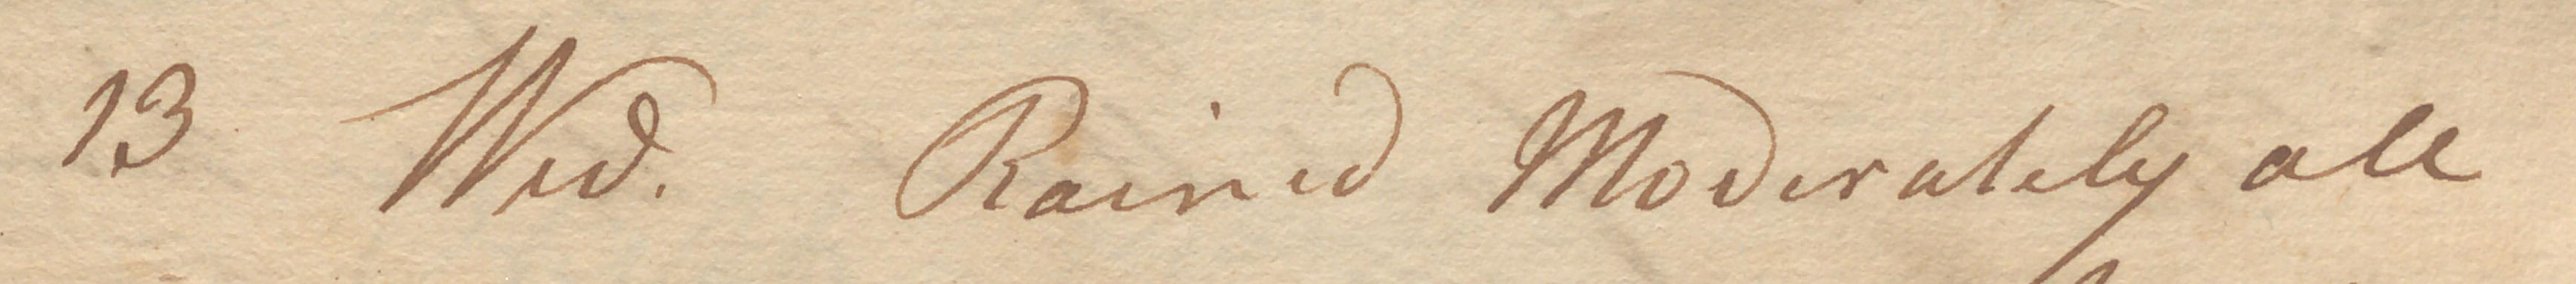13 Wed. Rained Moderately all
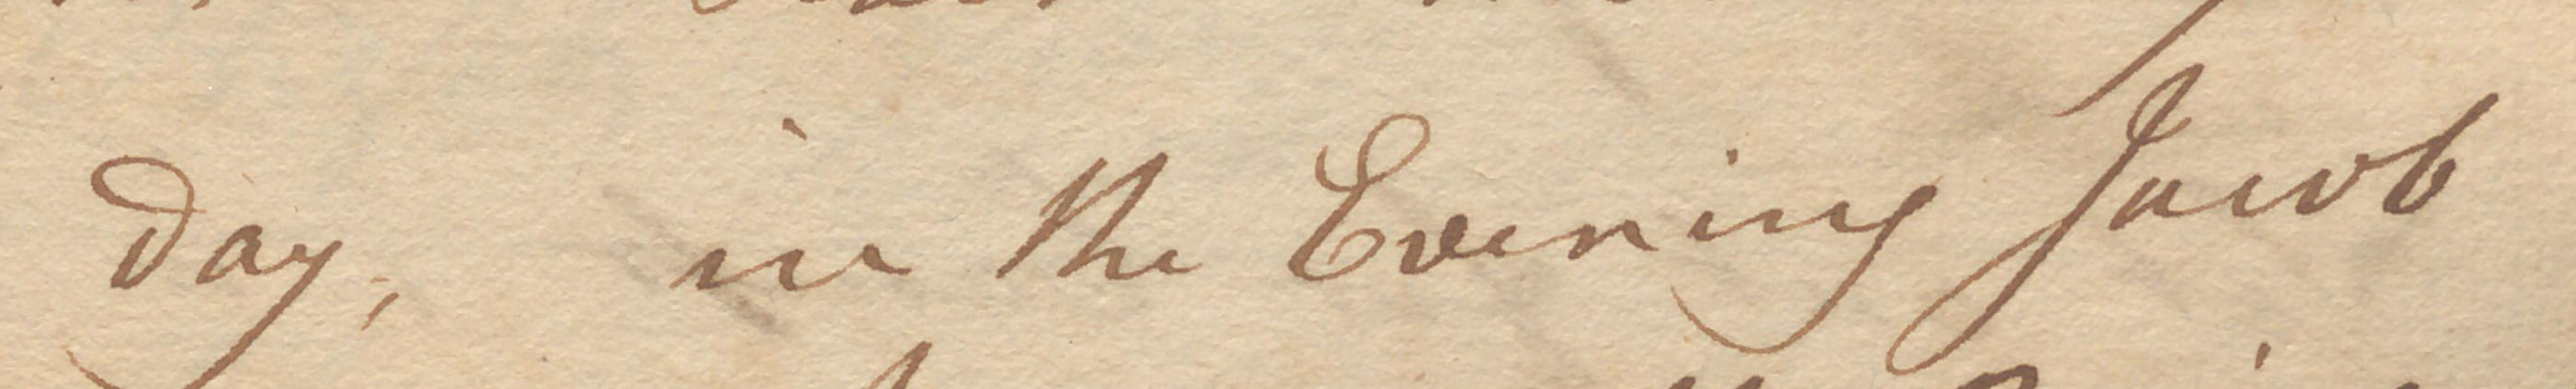day, in the Evening Jacob
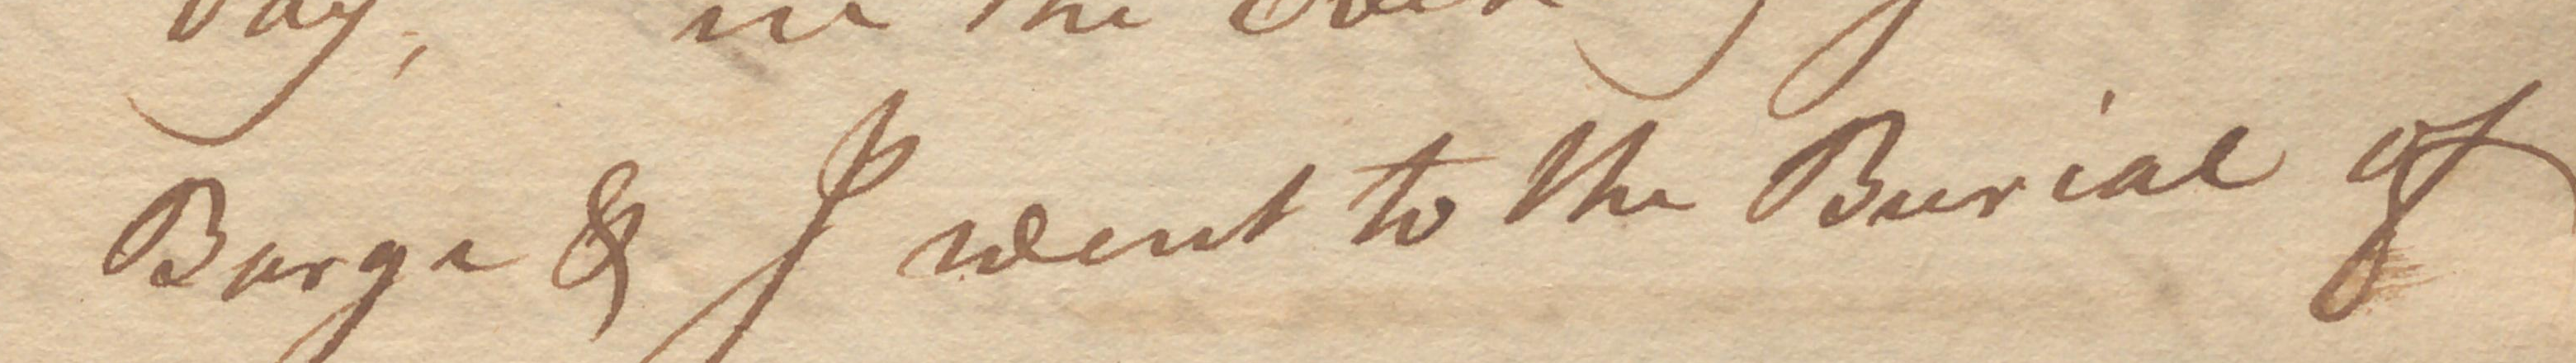Barge & I went to the Burial o
